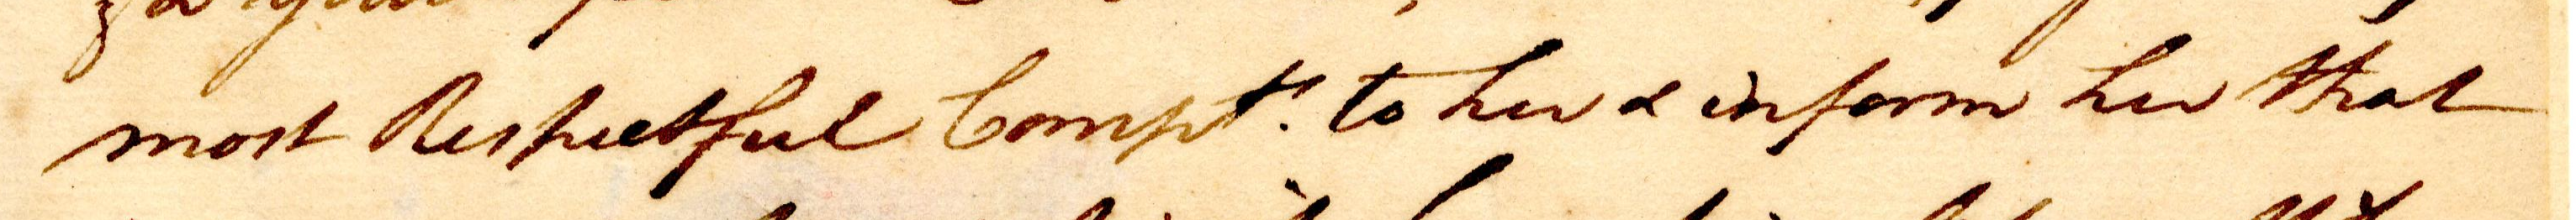most Respectful Comp^ts. to her & inform her that
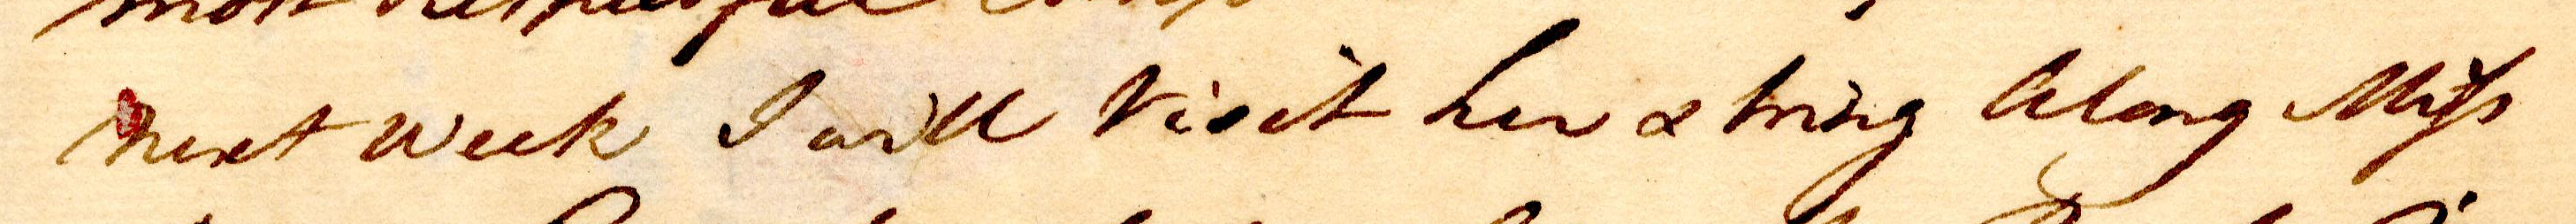next week I will Visit her & bring Along Miss
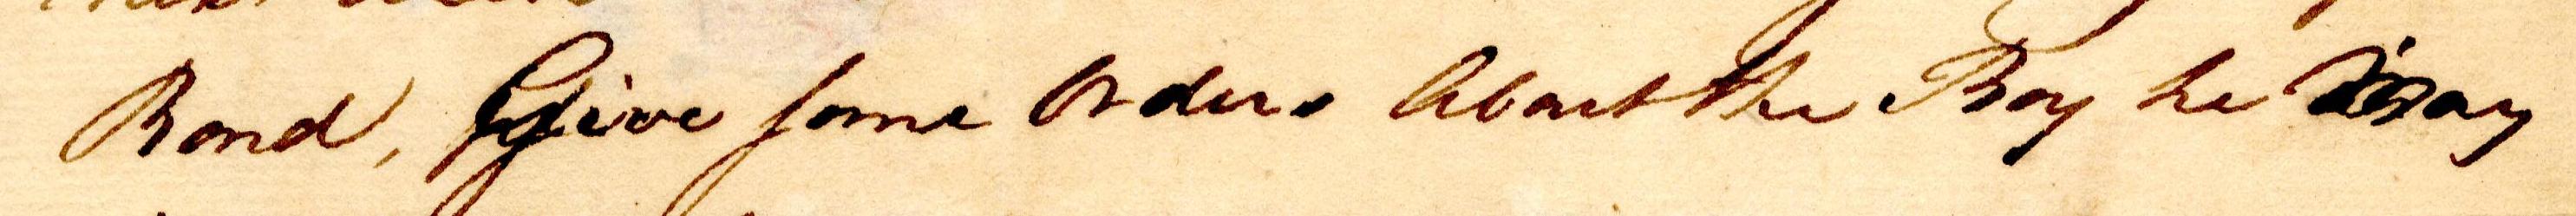Bond, Give some Orders About the Boy he May
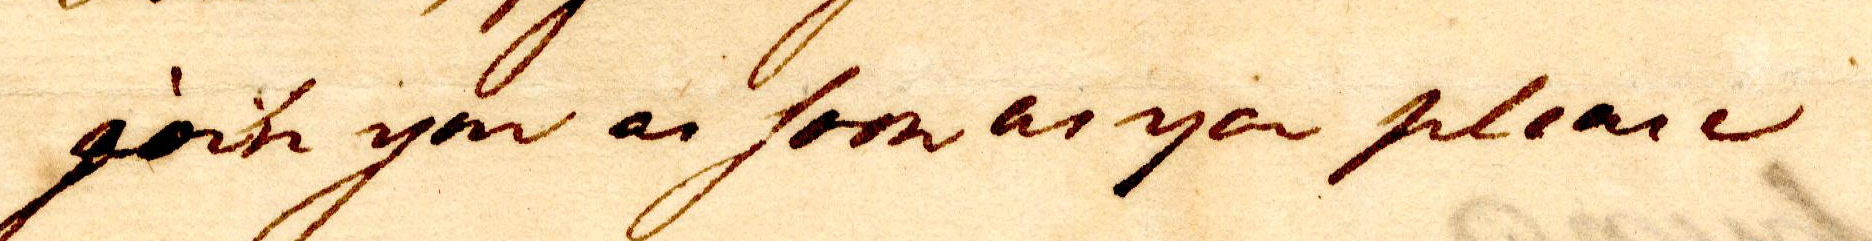join you as soon as you please
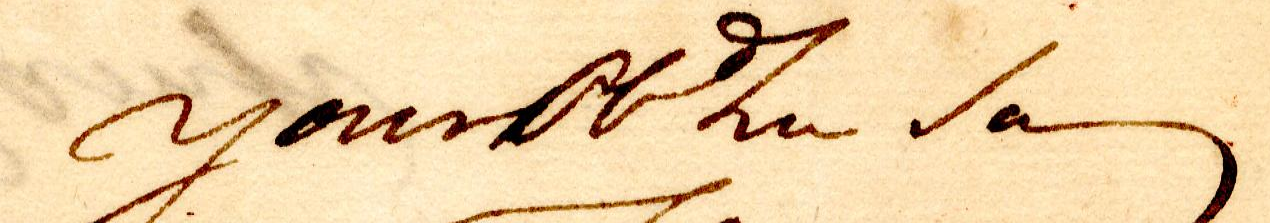Your Ob^d hu Ser
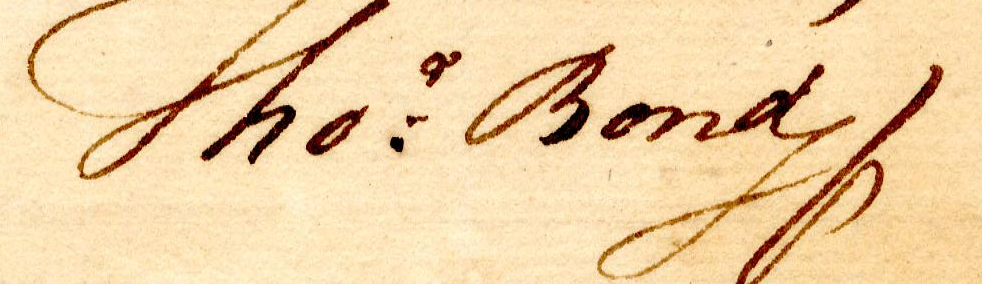Tho^s: Bond
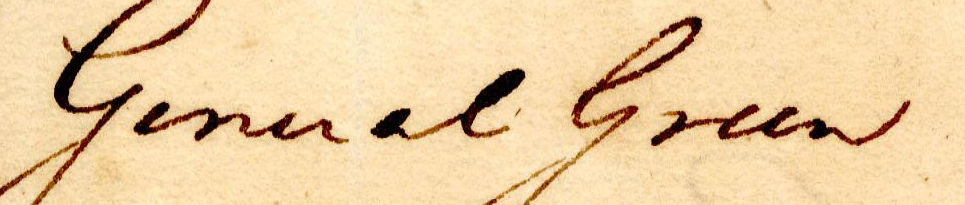General Green
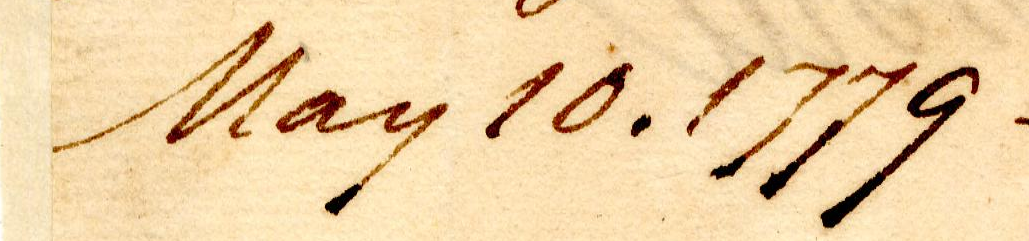May 10. 1779
